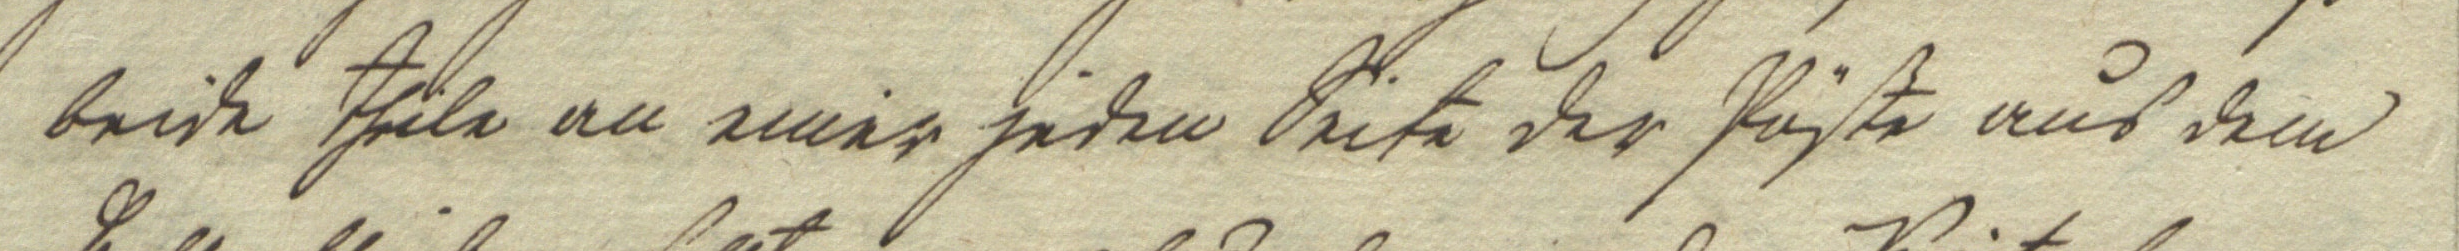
beide Theile an einer jeden Seite der Pöste aus dem
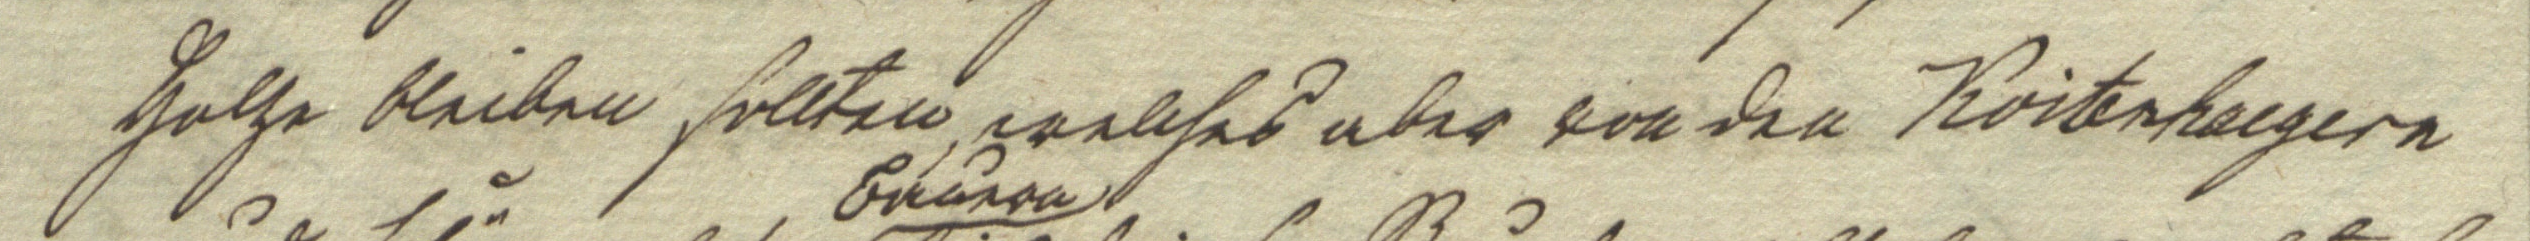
Holze bleiben sollten welches aber von den Koitenhaegern
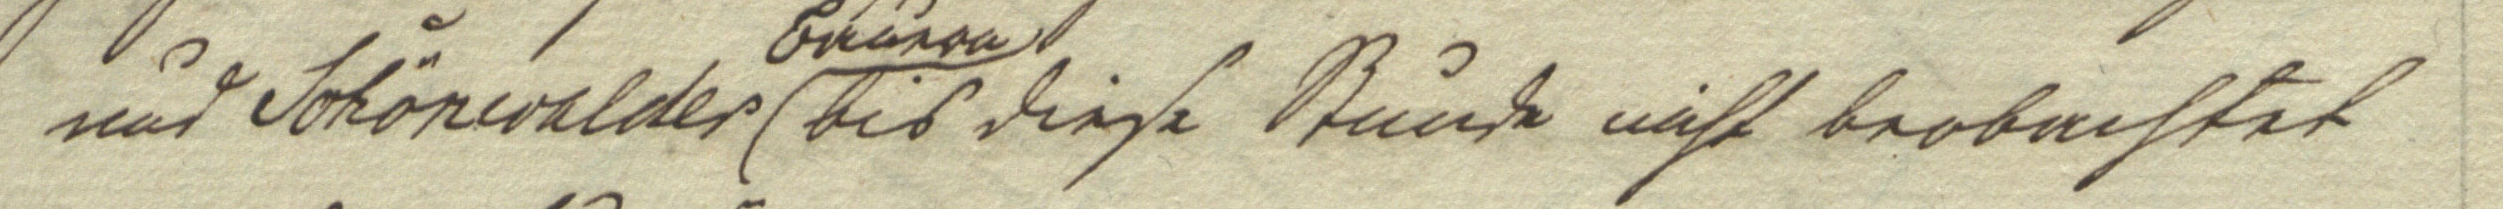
und Schönwalder Bauern bis diese Stunde nicht beobachtet
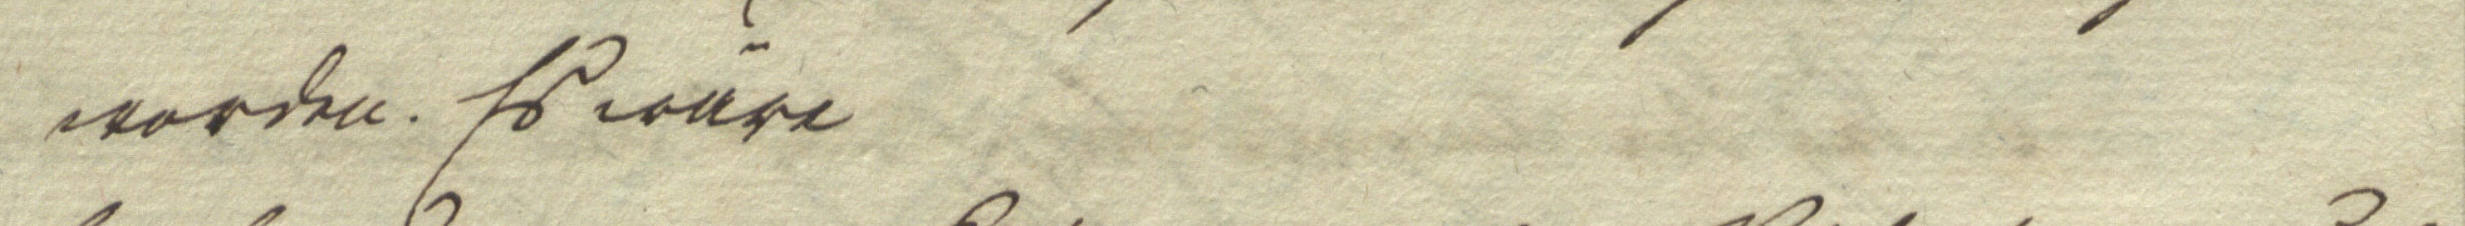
worden. Es wäre
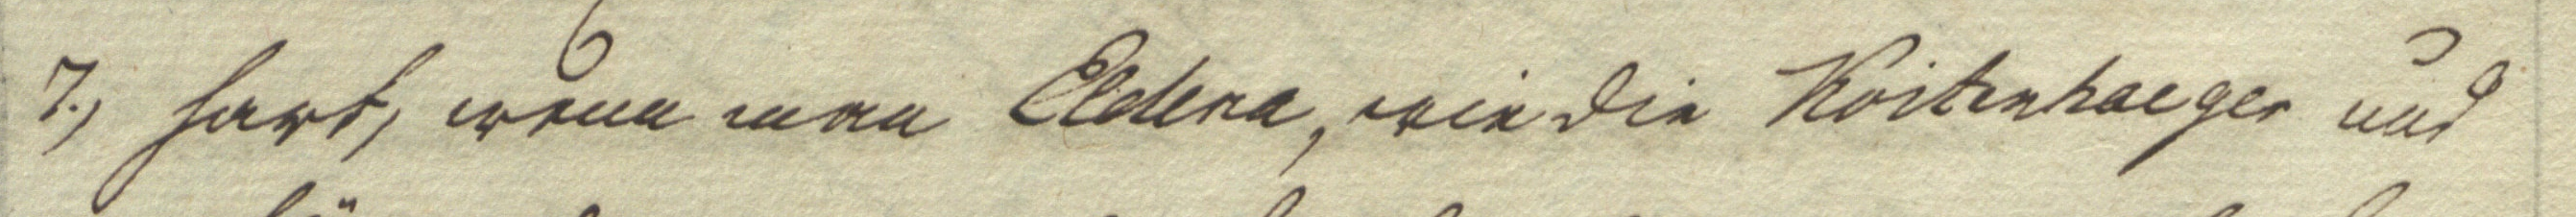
7., hart, wenn man Eldena, wie die Koitenhaeger und
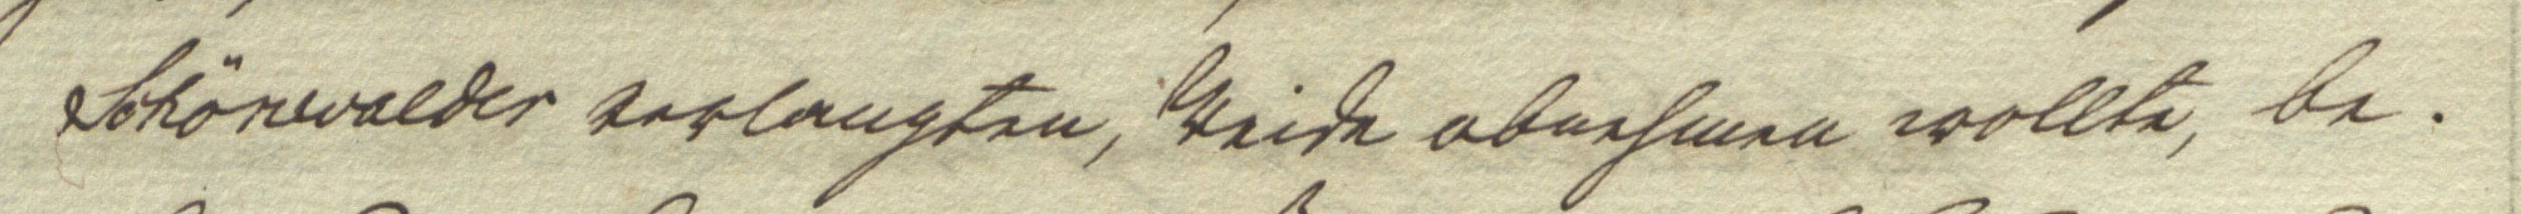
Schönwalder verlangten, Weide abnehmen wollte, be¬
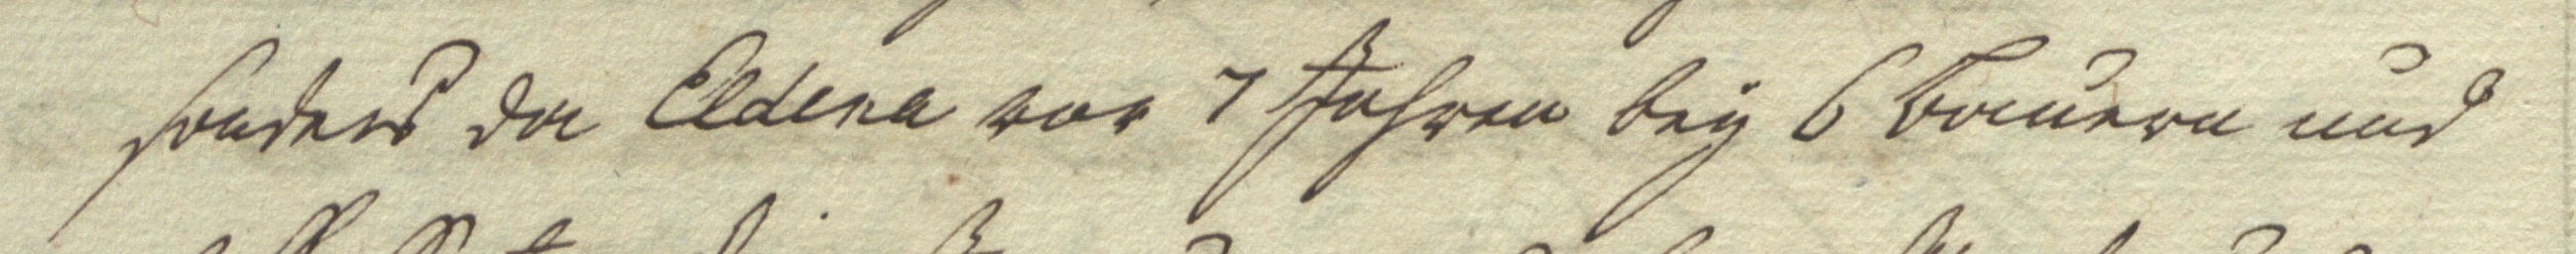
sonders da Eldena vor 7 Jahren bey 6 Bauern und
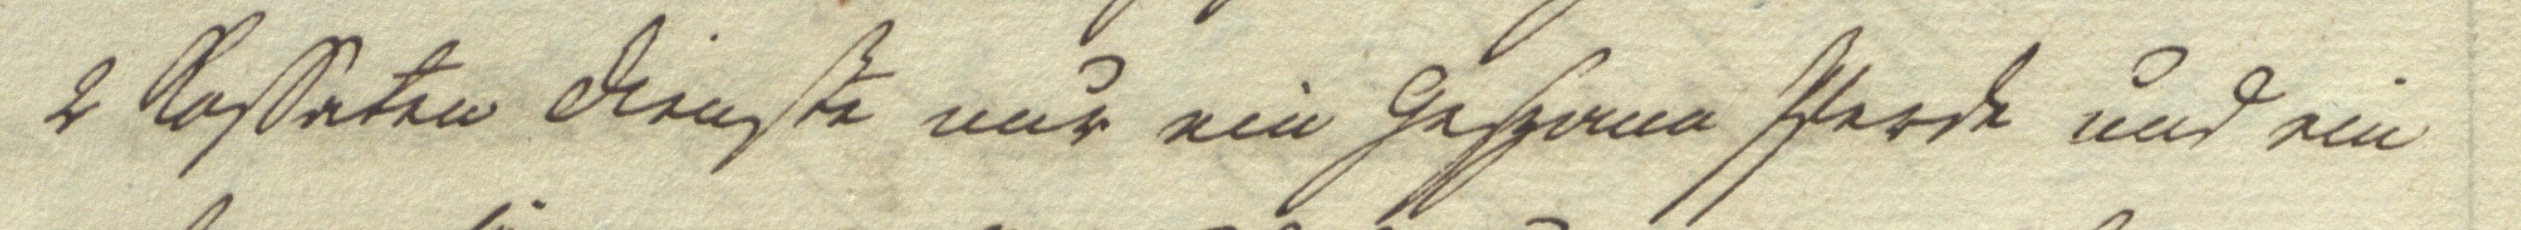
2 Kossaten Dienste nur ein Gespann Pferde und ein
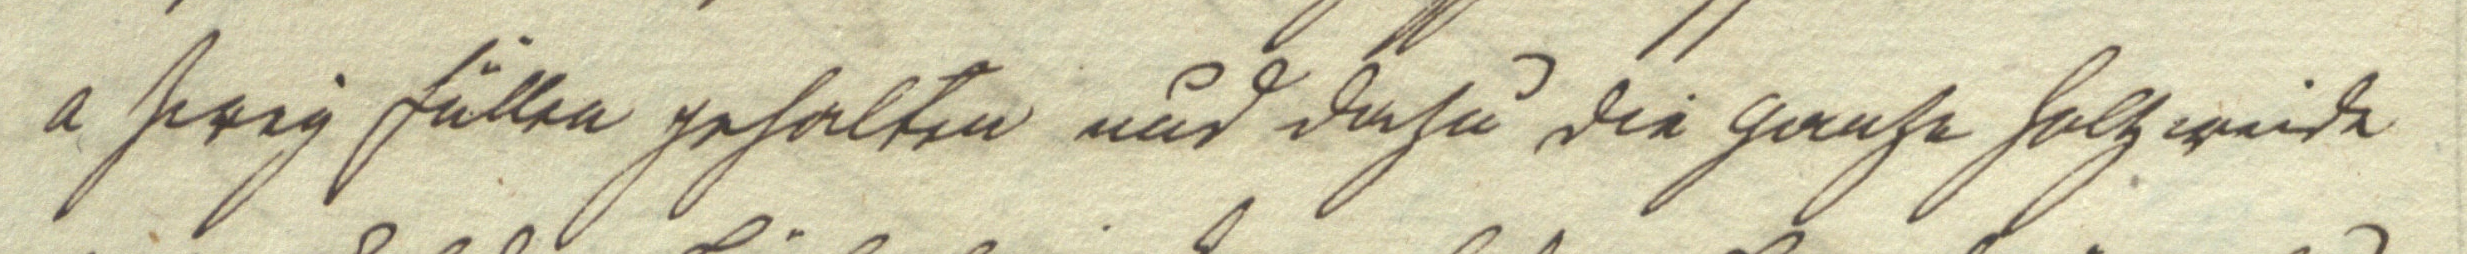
o Zwey Füllen gehalten und dazu die ganze Holzweide
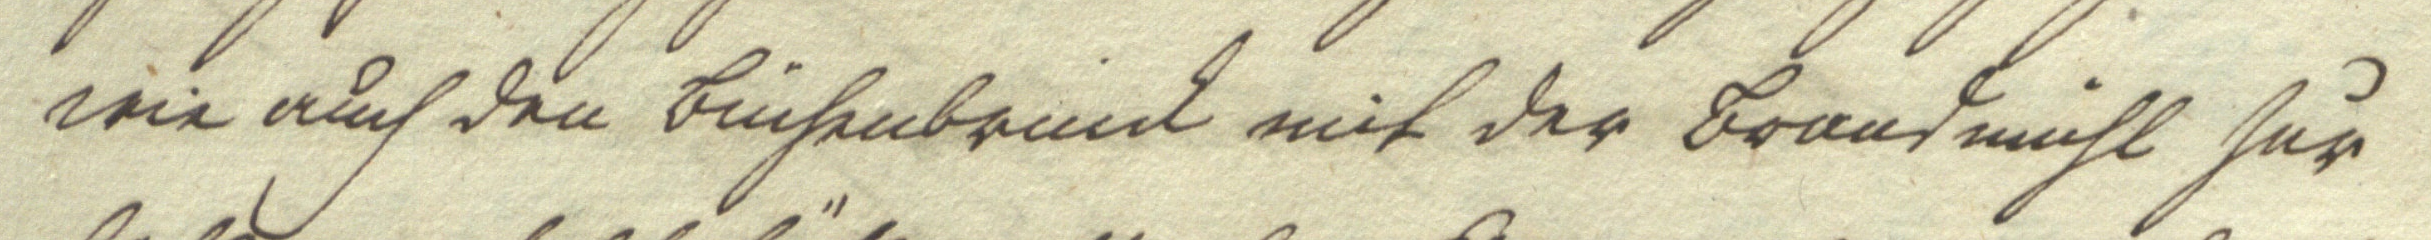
wie auch den Buchenbrand mit der Brandmühl zur
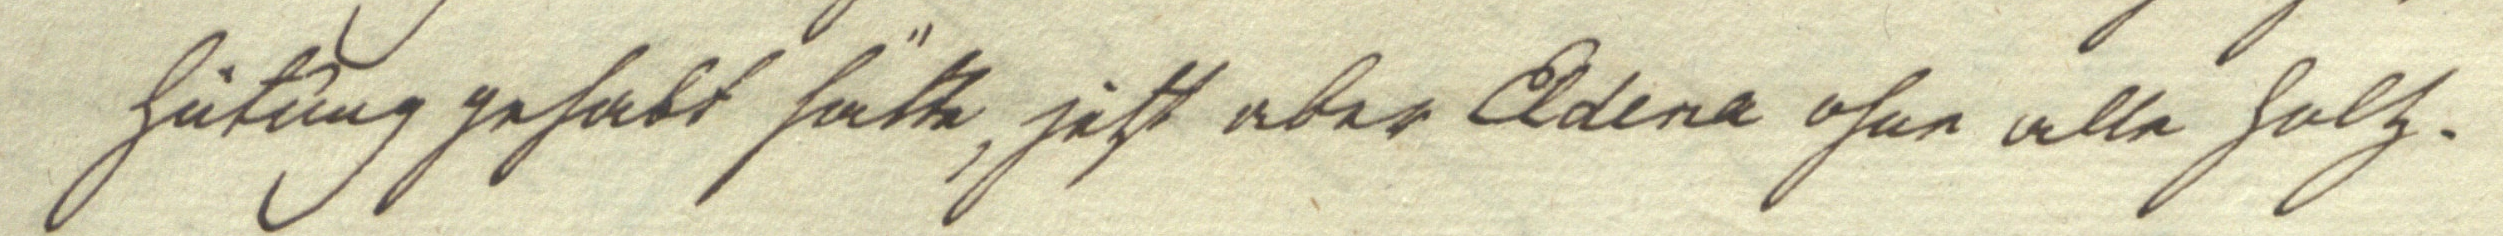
Hütung gehabt hätte, jetzt aber Eldena ohne alle Holz¬
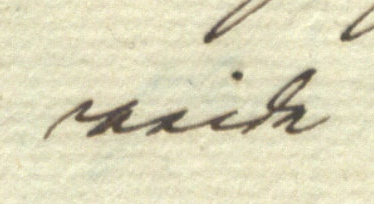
weide
